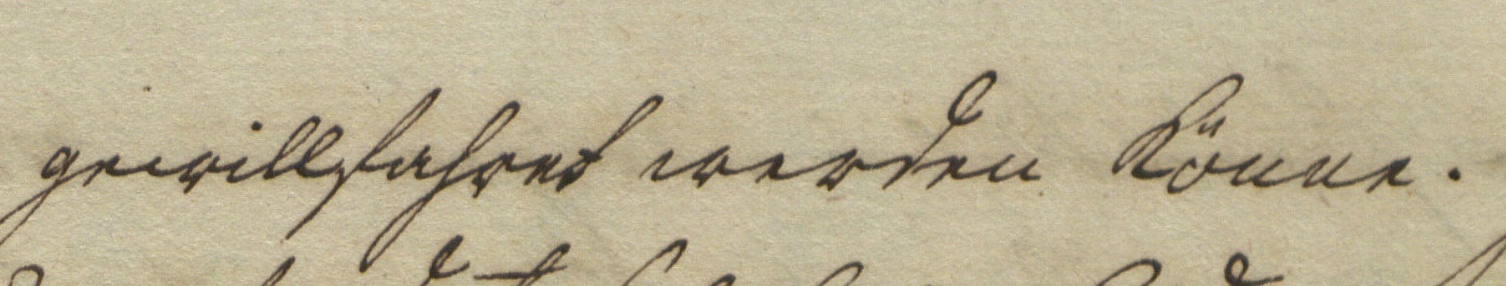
gewillfahret werden könne.
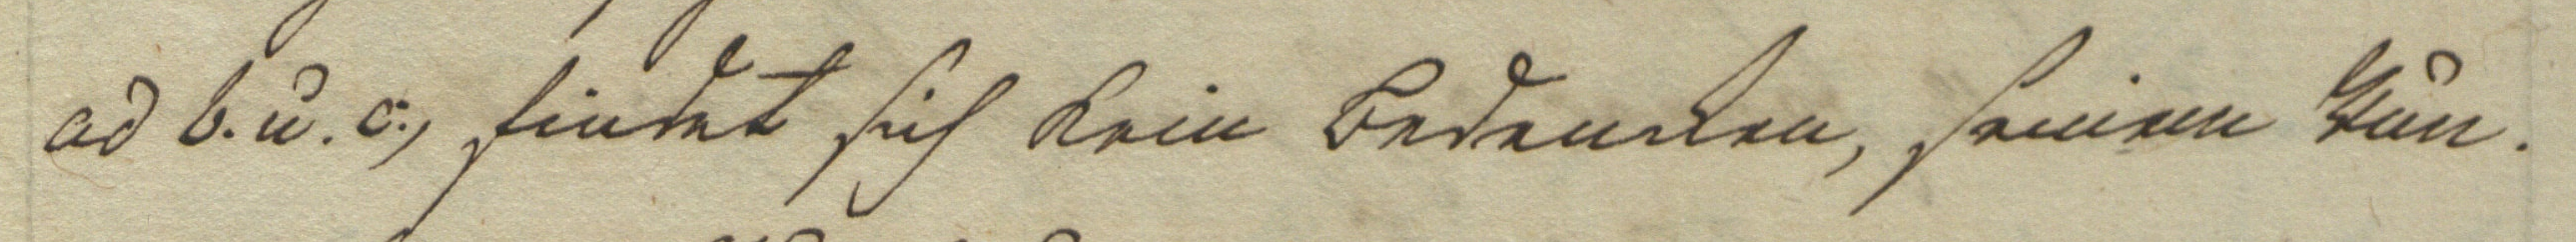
ad b. u. c., findet sich kein Bedencken, seinem Wun¬
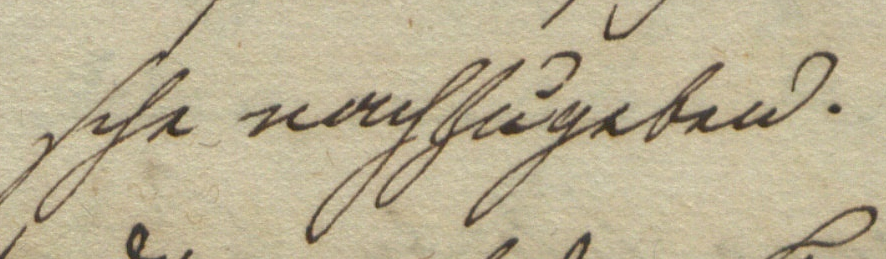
sche nachzugeben.
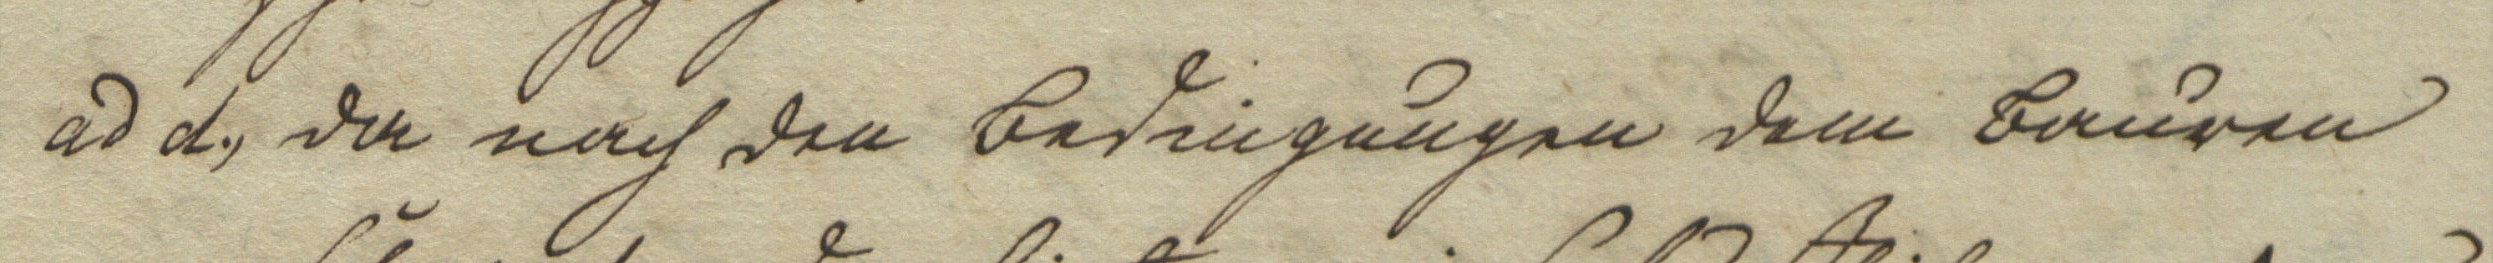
ad d., da nach den Bedingungen dem Bauren
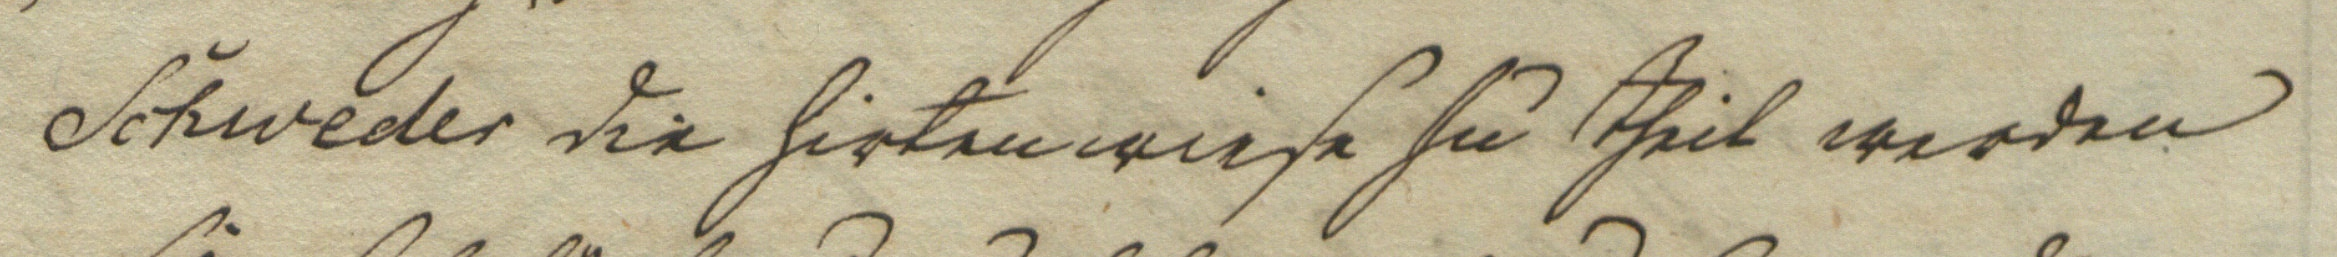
Schweder die Hirtenwiese zu Theil werden
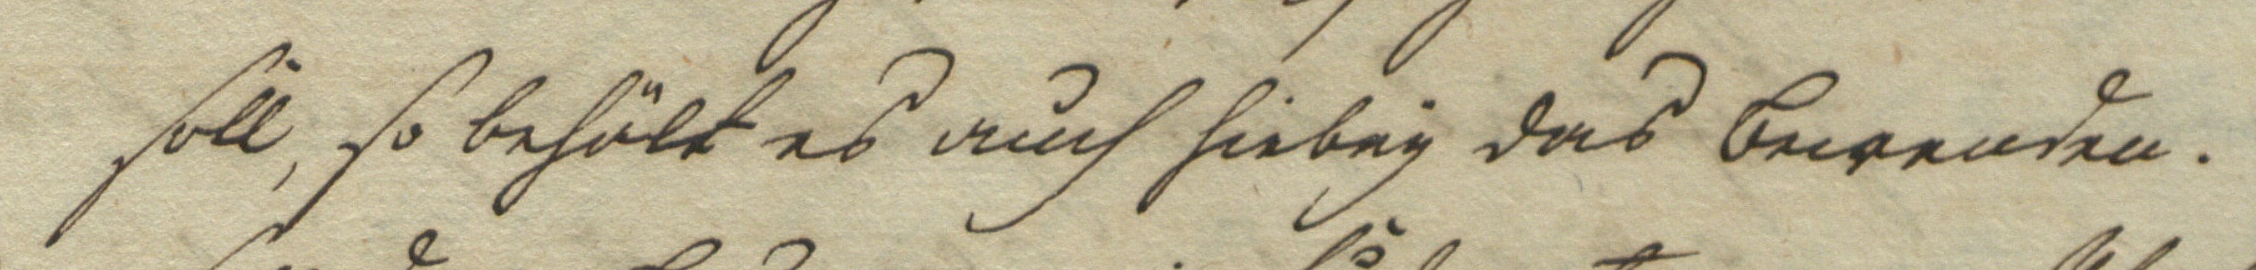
soll, so behält es auch hiebeÿ das Bewenden.
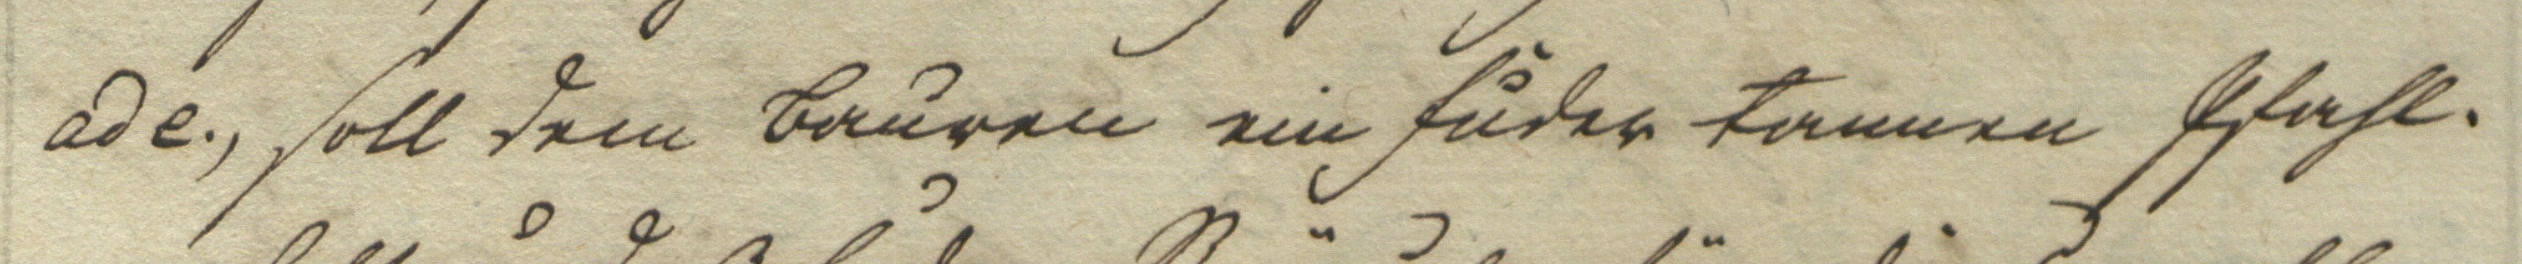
ad e., soll dem Bauren ein Fuder Tannen Pfahl-
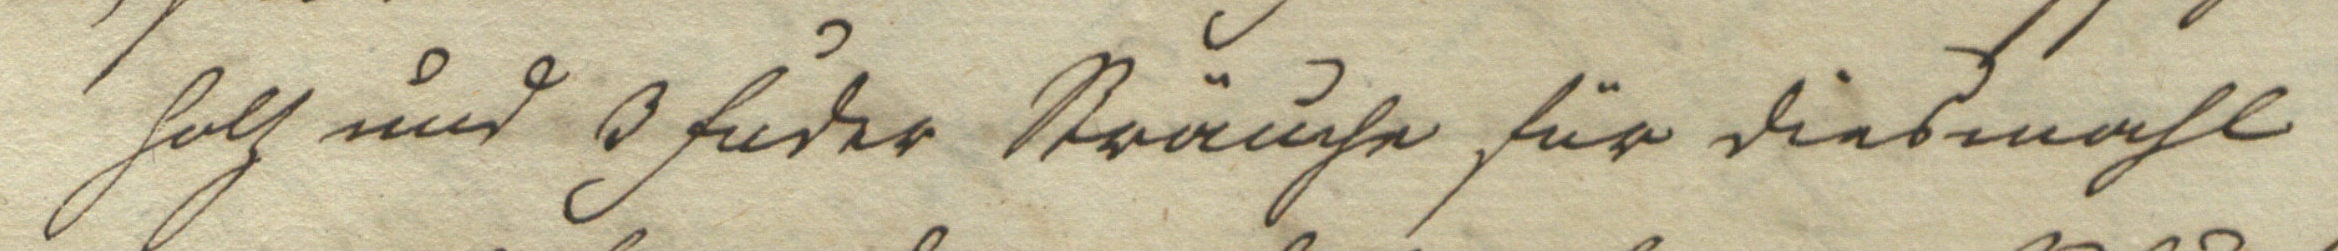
holz und 3 Fuder Sträuche für diesmahl
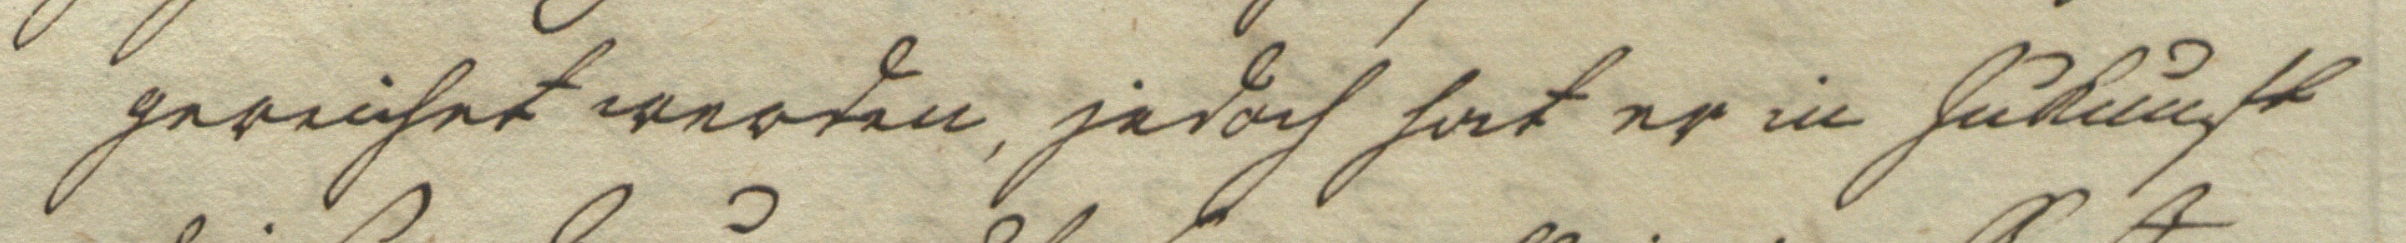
gereichet werden, jedoch hat er in Zukunft
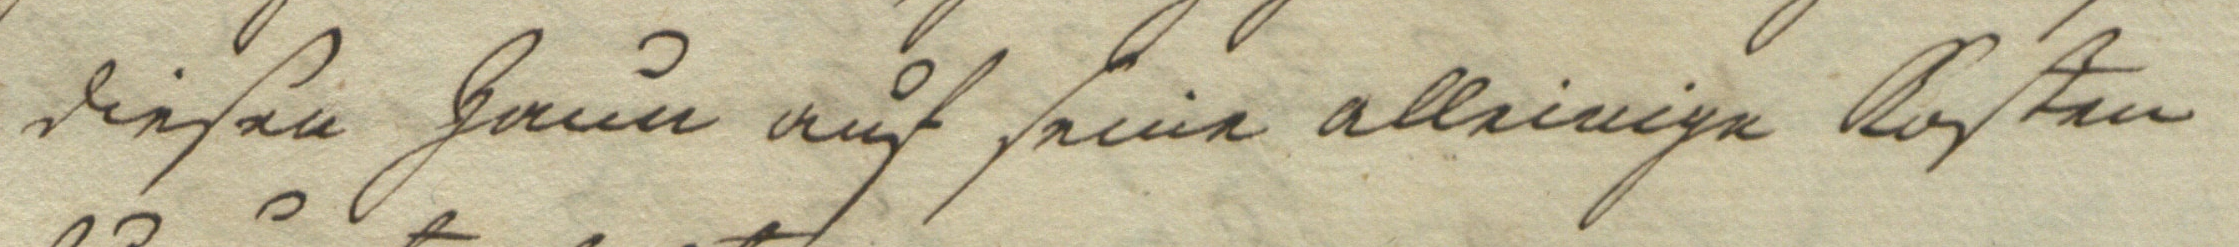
diesen Zaun auf seine alleinige Kosten
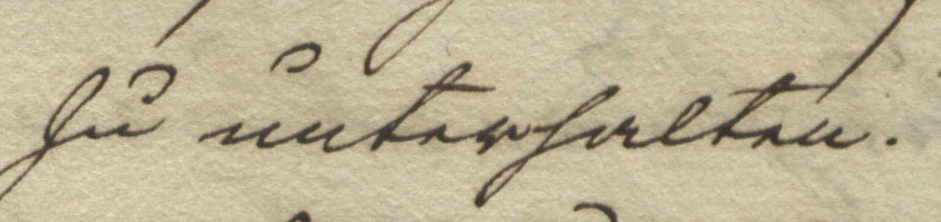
zu unterhalten.
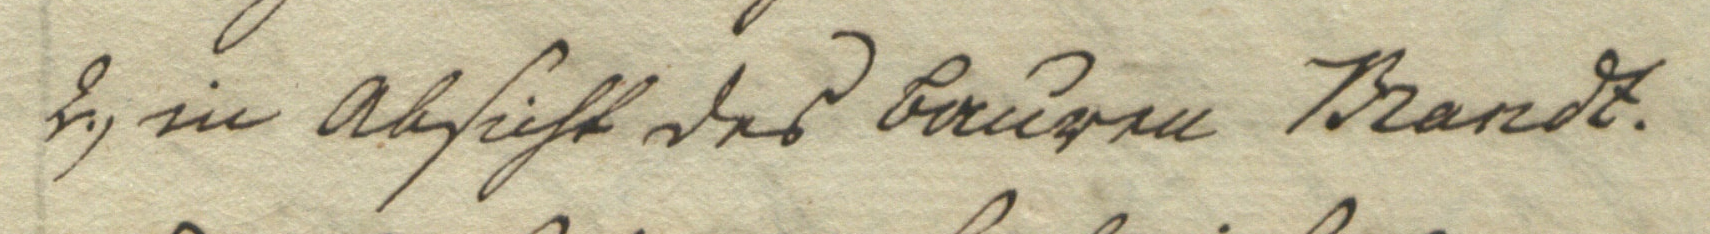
2., in Absicht des Bauren Brandt.
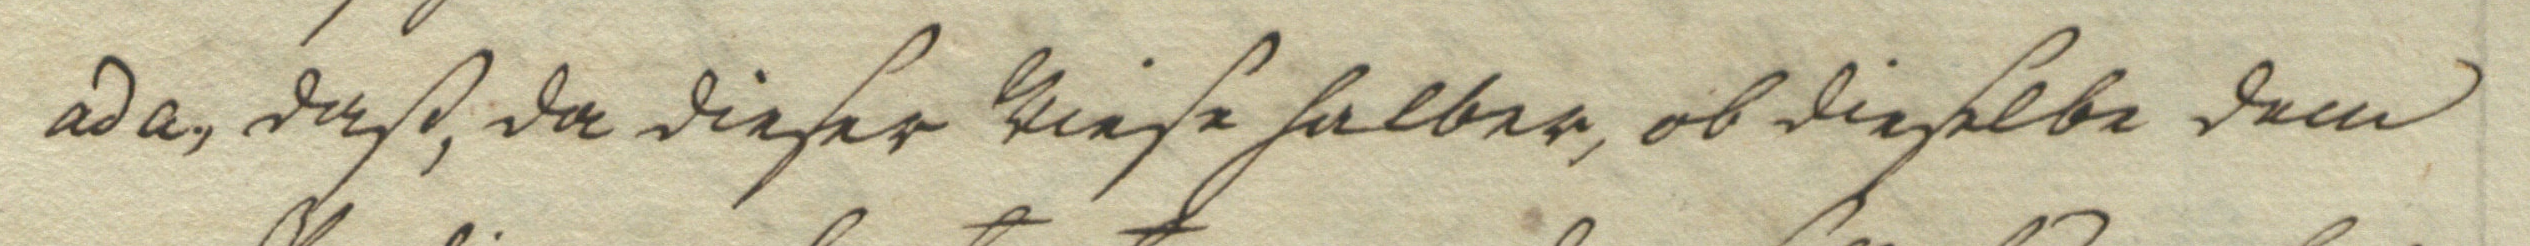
ad a., daß da dieser Wiese halber, ob dieselbe dem
